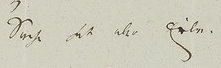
Sache hat aber Eile.
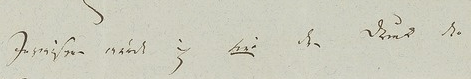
Inzwischen würde ich hier den Druck der
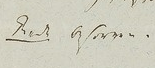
Rede besorgen.
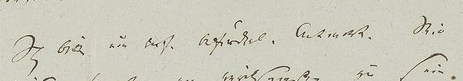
Ich bitte um pers. beförderl. Antwort. Mir
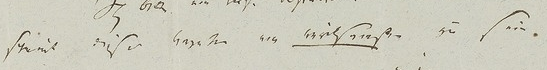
scheint dieses Vorgehen am wirksamsten zu sein.
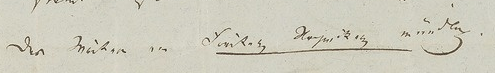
Das Weitere am Freitag Nachmittag mündlich.
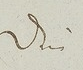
Dein
